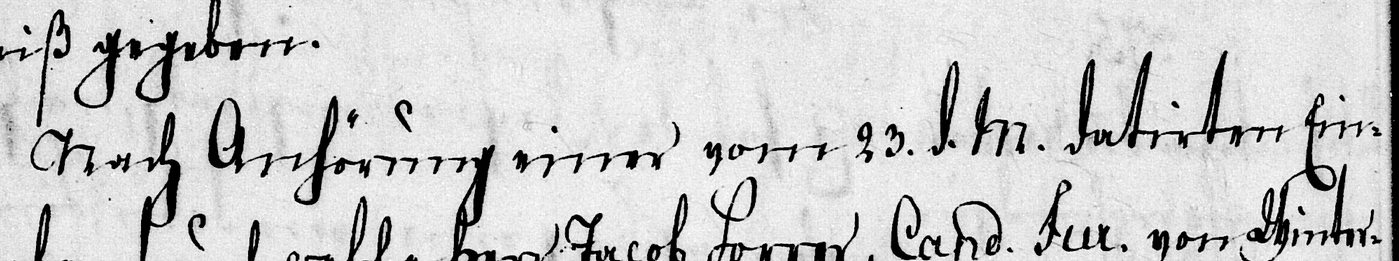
Nach Anhörung einer vom 23. d. M. datirten Ein¬
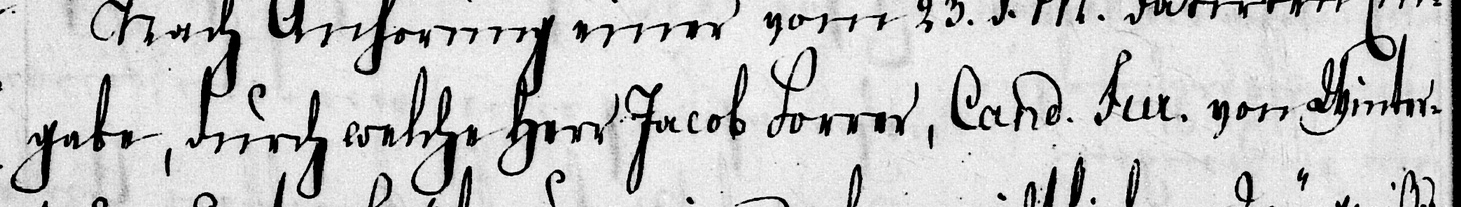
gabe, durch welche Herr Jacob Forrer, Cand. Jur. von Winter¬
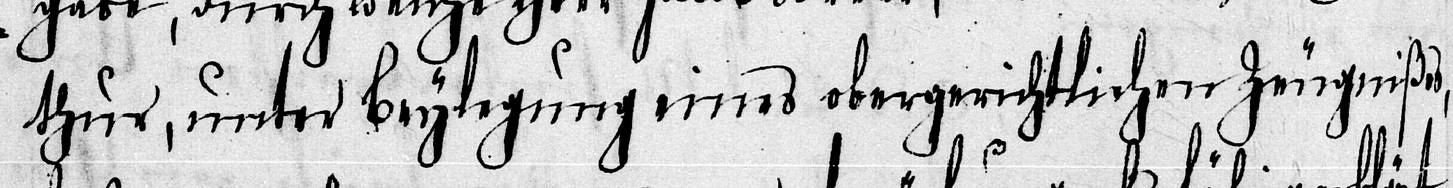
thur, unter Beylegung eines obergerichtlichen Zeugniß¬
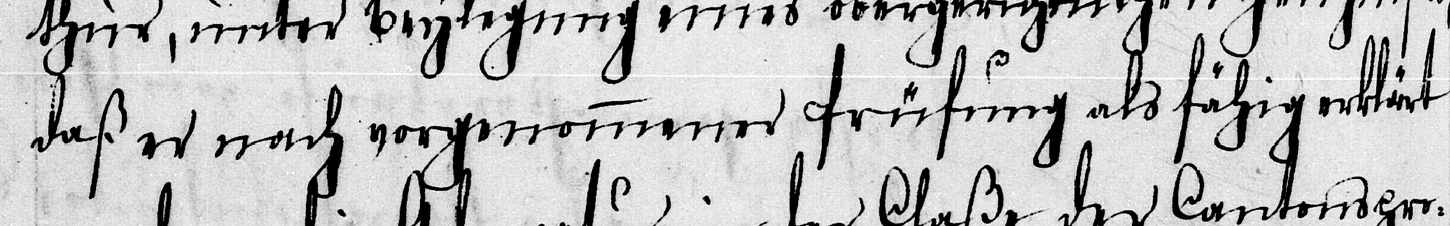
daß er nach vorgenommener Prüfung als fähig erklärt
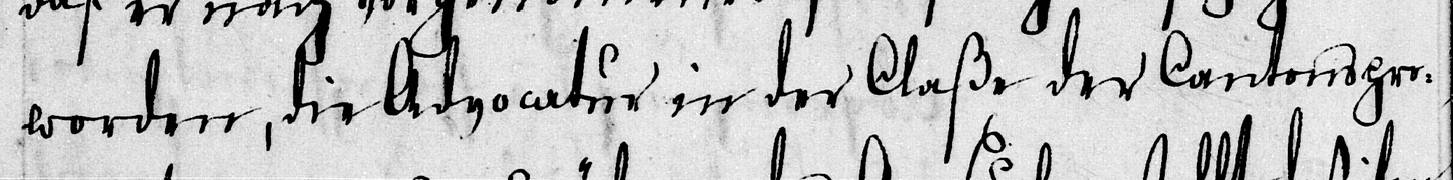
worden, die Advocatur in der Claße der Cantonspro¬
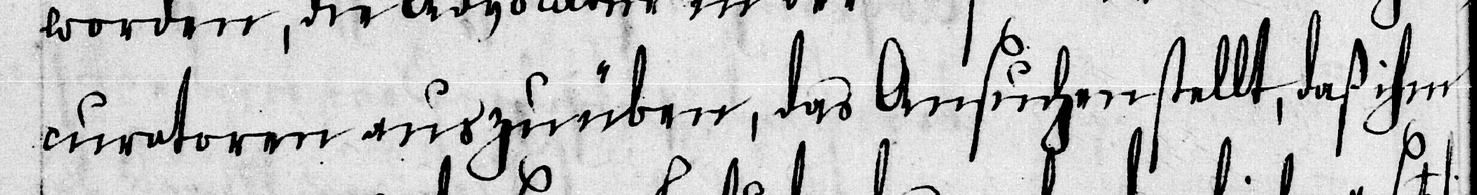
curatoren auszuüben, das Ansuchen stellt, daß ihm
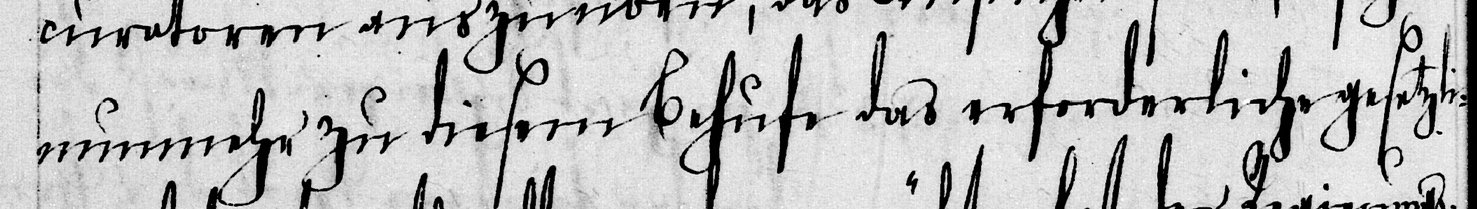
nunmehr zu diesem Behufe das erforderliche gesetz¬
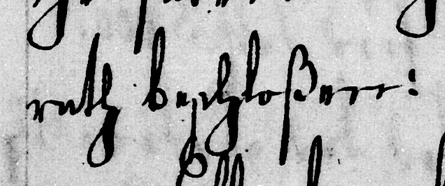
rath beschloßen:
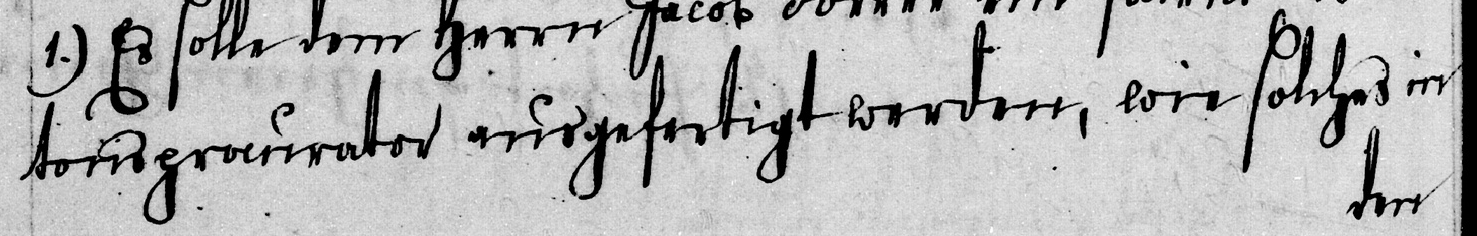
tonsprocurator ausgefertigt werden, wie solches in
